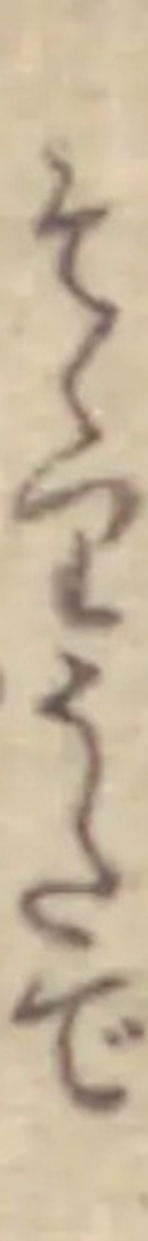そゝりうたで
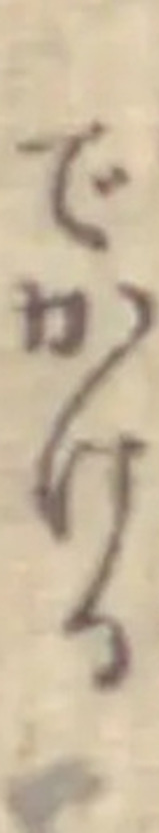でかける
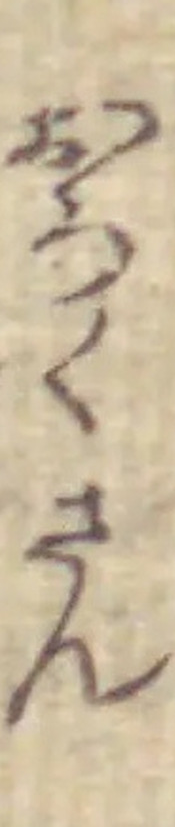おろくさん
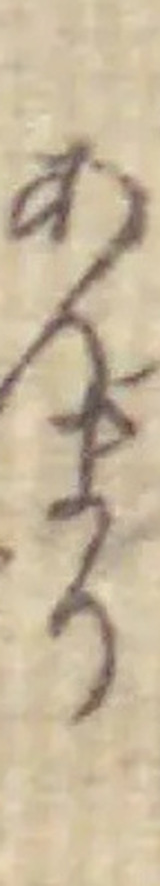あんまり
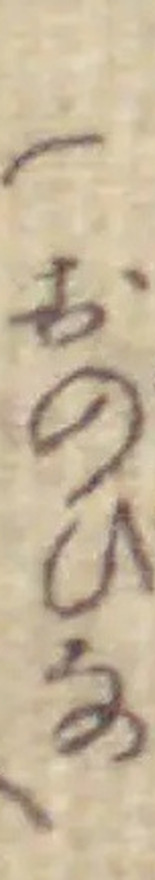おのびな
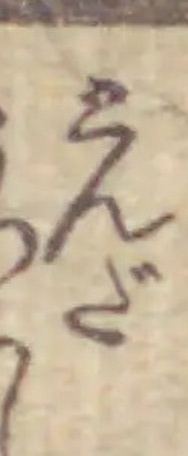とんだ
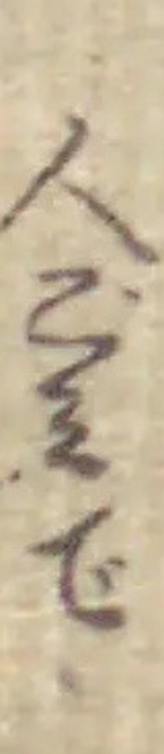人ごみで
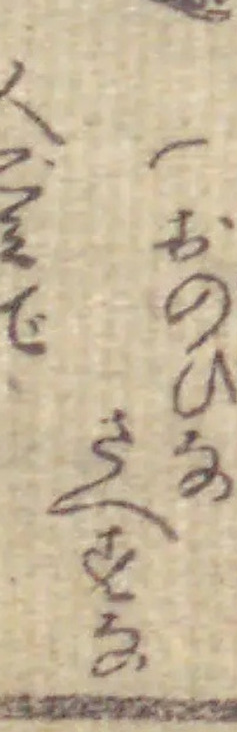さへすな
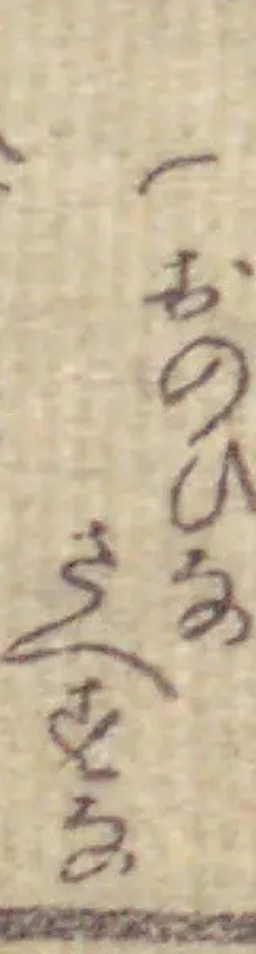さへすな
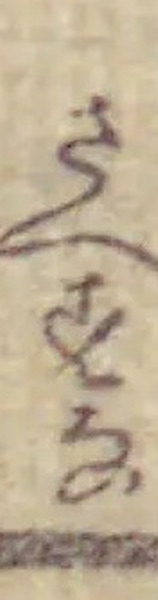さへすな
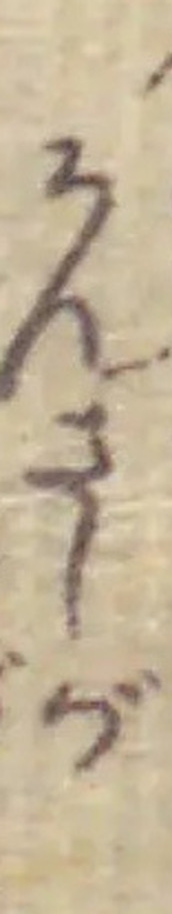かんざしが
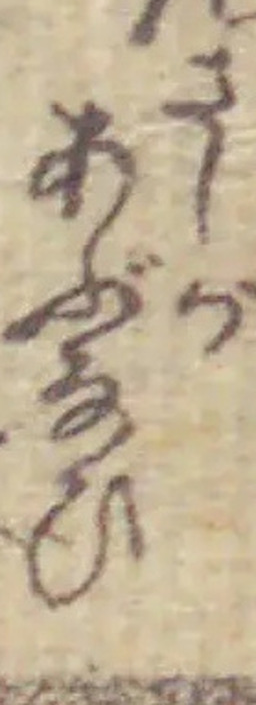あぶなひ
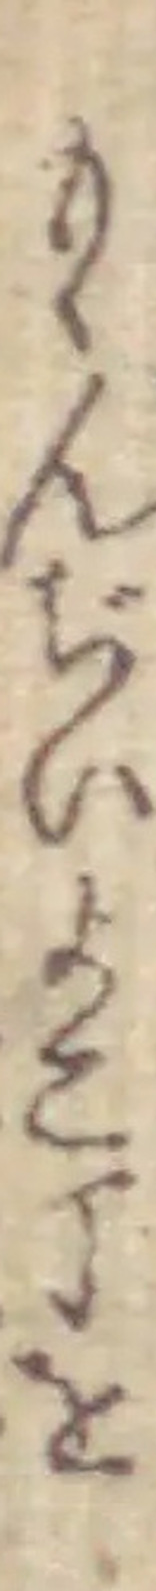もゝんぢいよこ丁を
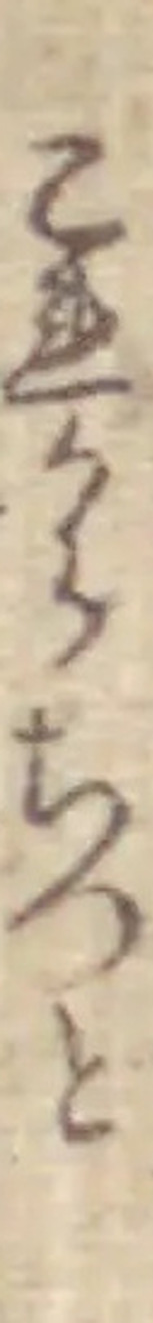これからちつと
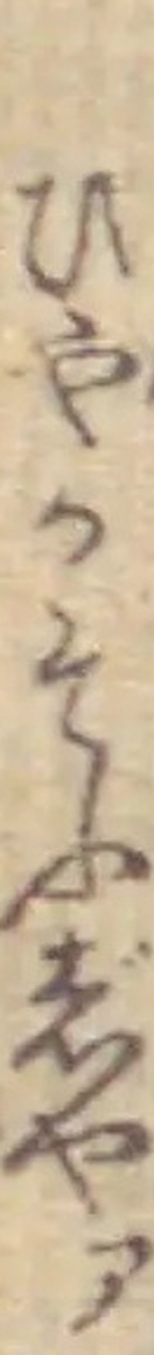ひやかそふじやァ

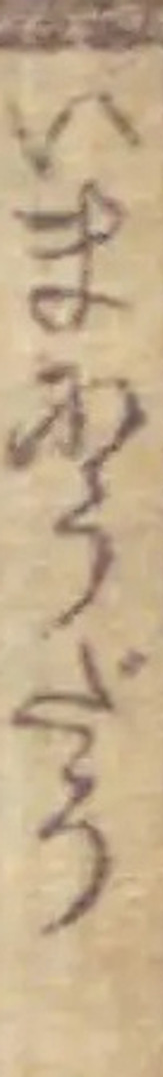いまにうだう
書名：大昔化物双紙 2巻
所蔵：国立国会図書館 National Diet Library, JAPAN
